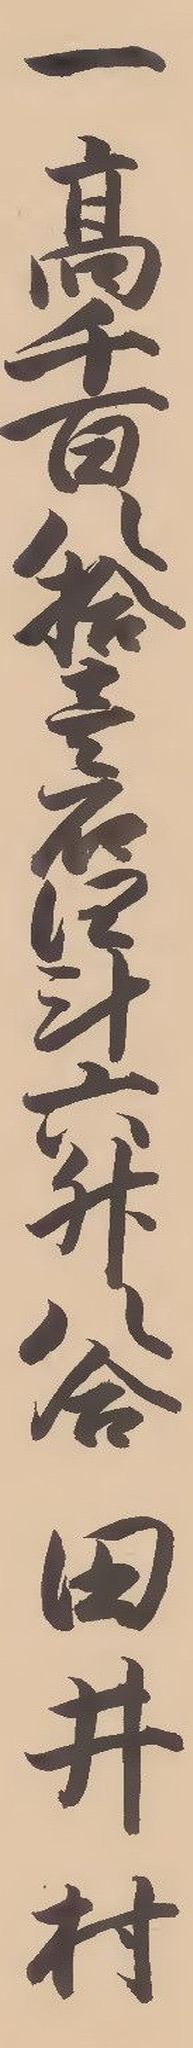一髙千百八拾壱石四斗六升八合田井村
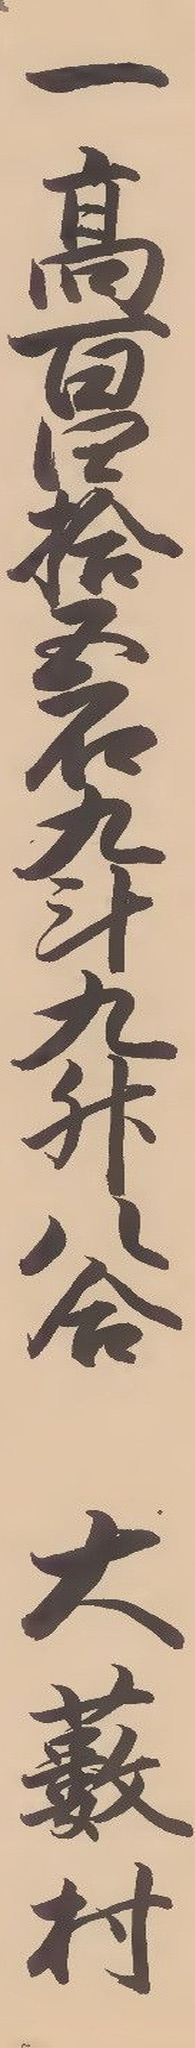一髙百四拾五石九斗九升八合大藪村
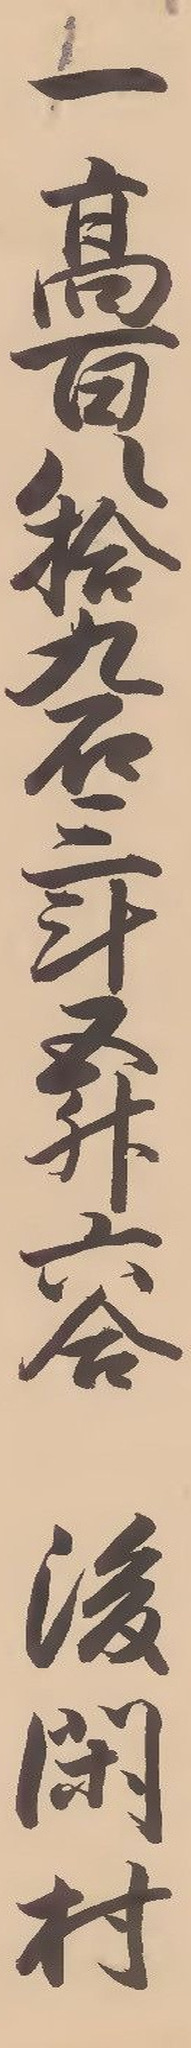一髙百八拾九石三斗五升六合後閑村

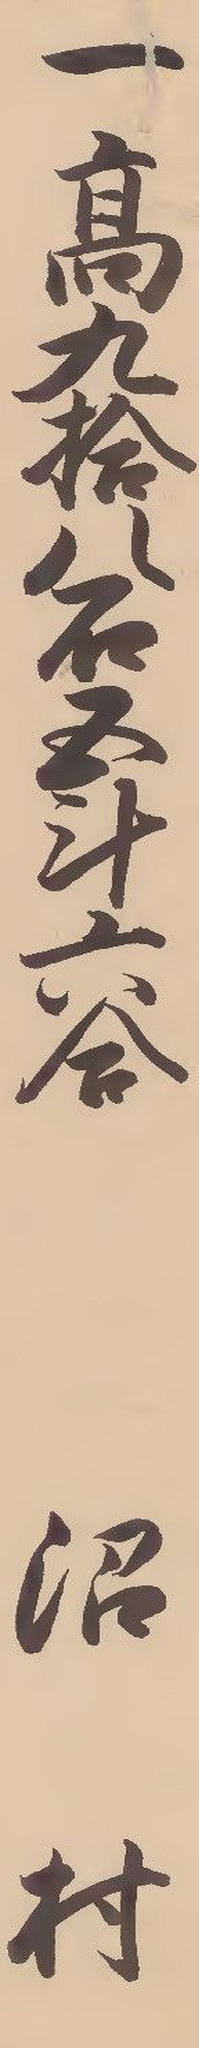一髙九拾八石五斗六合沼村
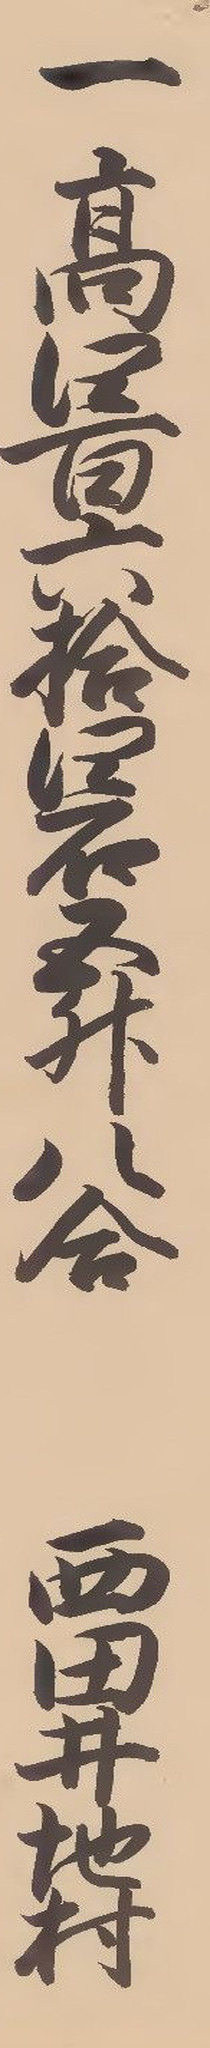一髙四百六拾四石五升八合西田井地村
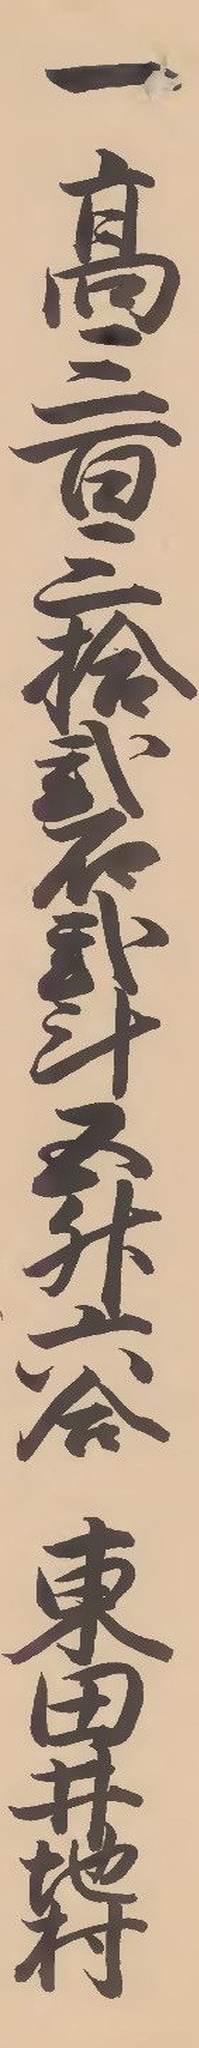一髙三百三拾弐石弐斗五升六合東田井地村
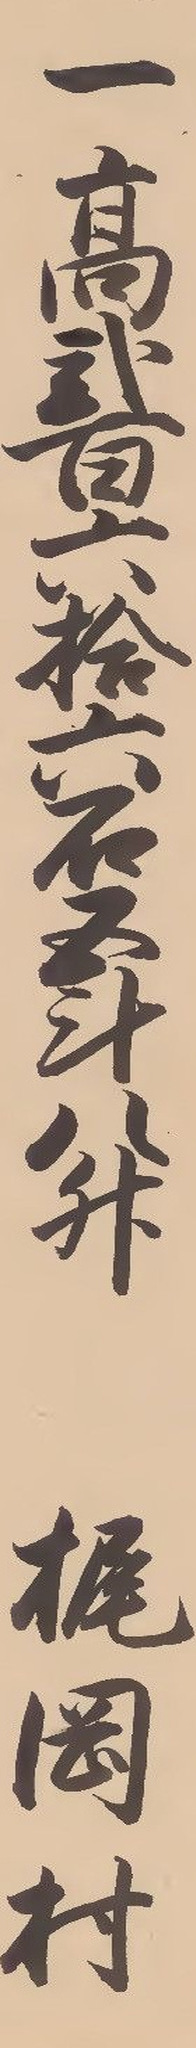一髙弐百六拾六石五斗八升梶岡村
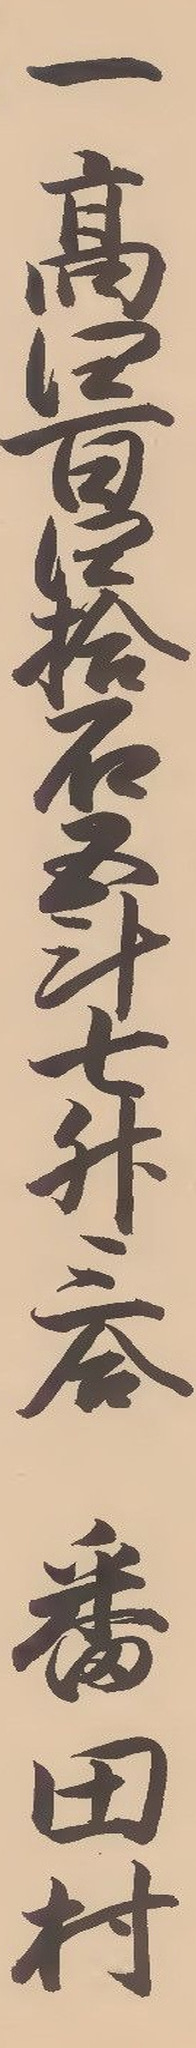一髙四百四拾石五斗七升三合番田村
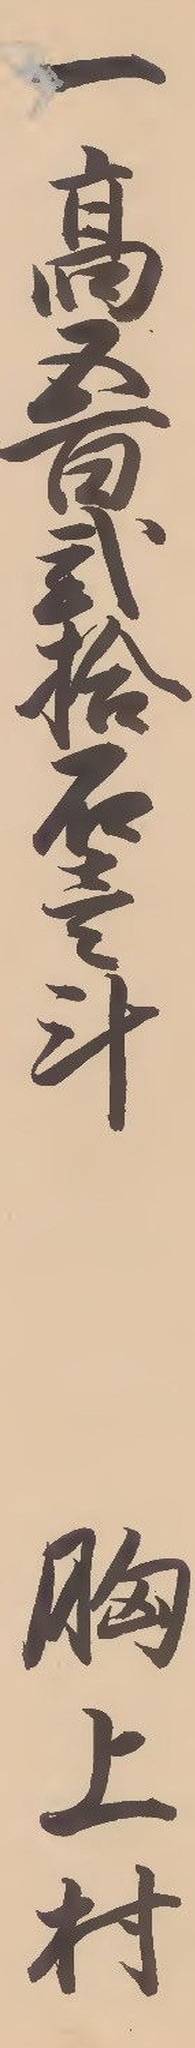一髙五百弐拾石壱斗胸上村
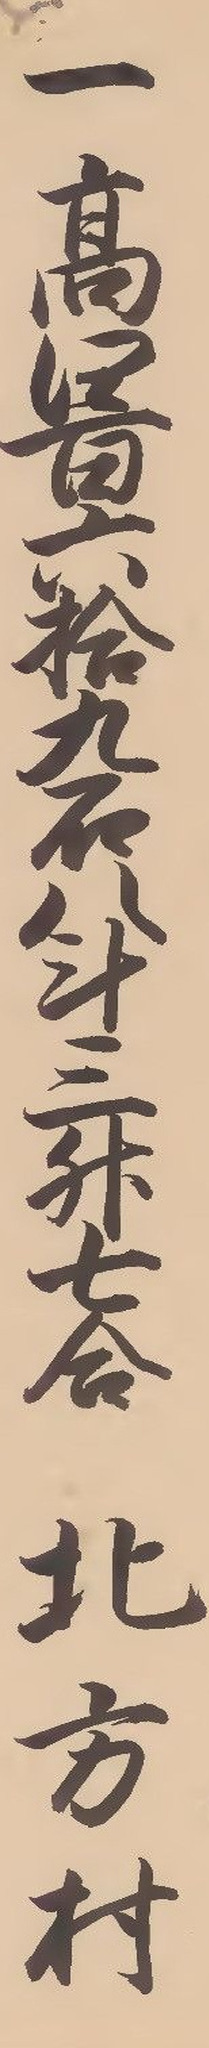一髙四百六拾九石八斗三升七合北方村
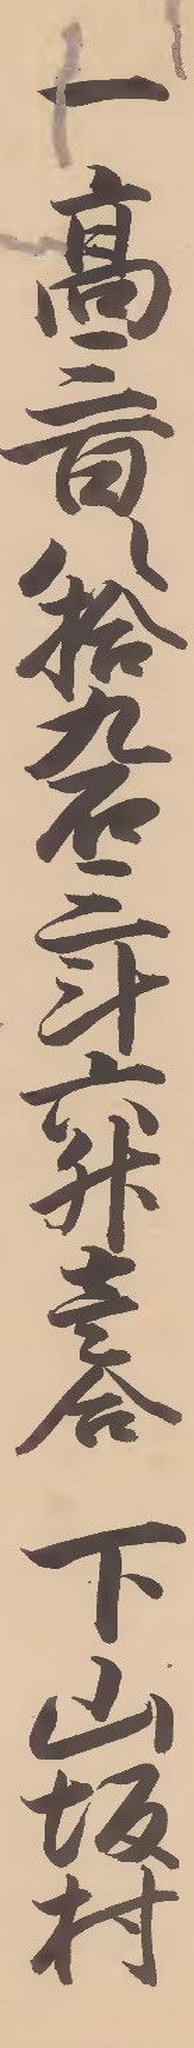一髙三百八拾九石三斗六升壱合下山坂村

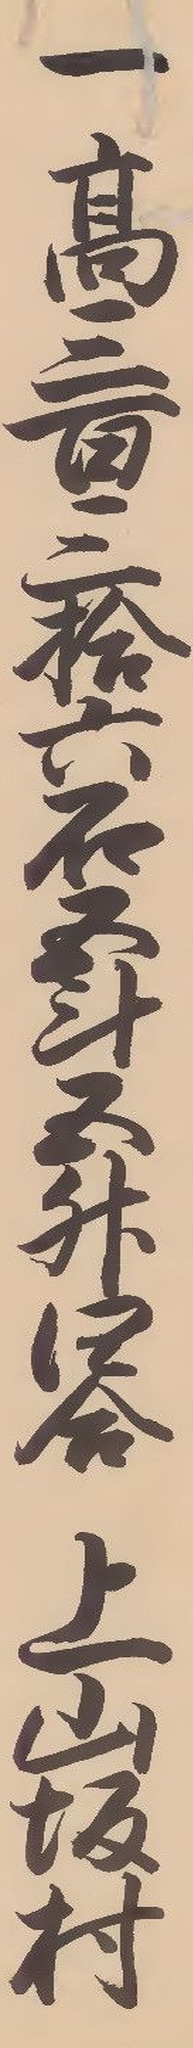一髙三百三拾六石五斗五升四合上山坂村
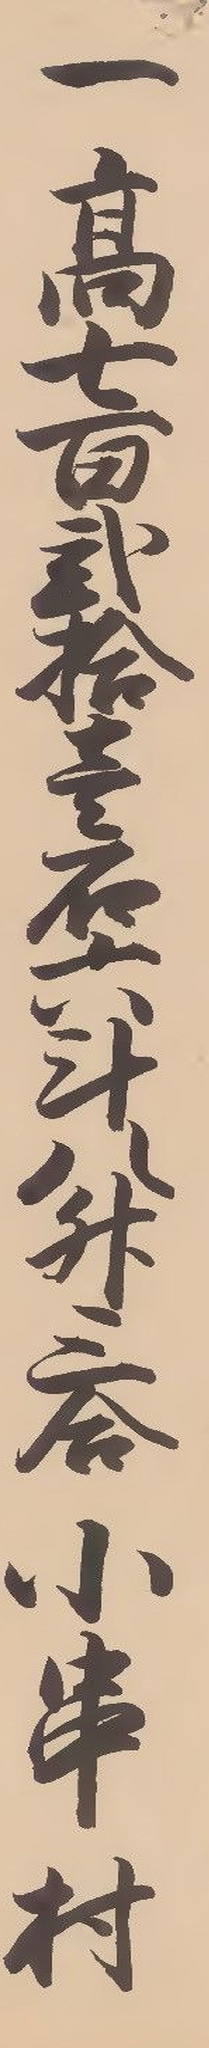一髙七百弐拾壱石六斗八升三合小串村
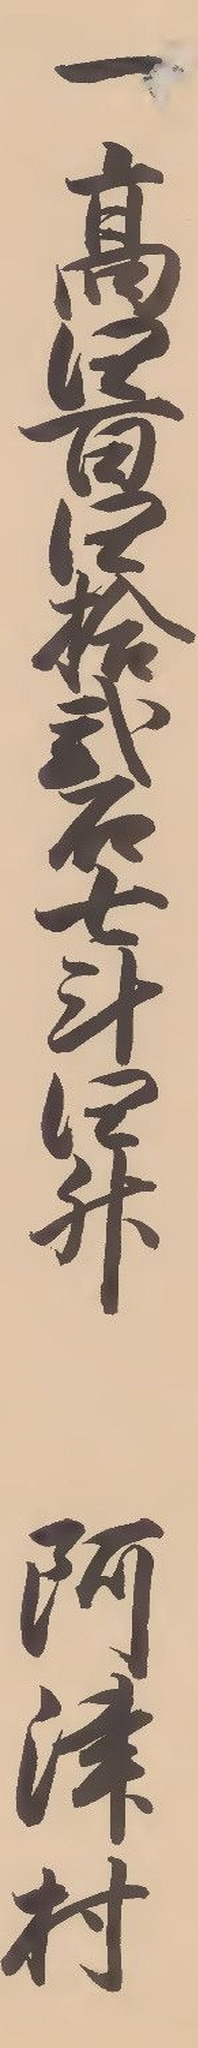一髙四百四拾弐石七斗四升阿津村
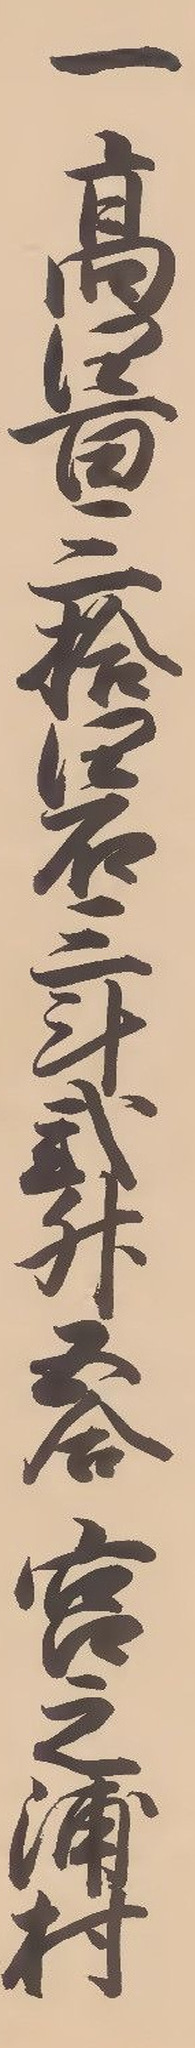一髙四百三拾四石三斗弐升五合宮之浦村
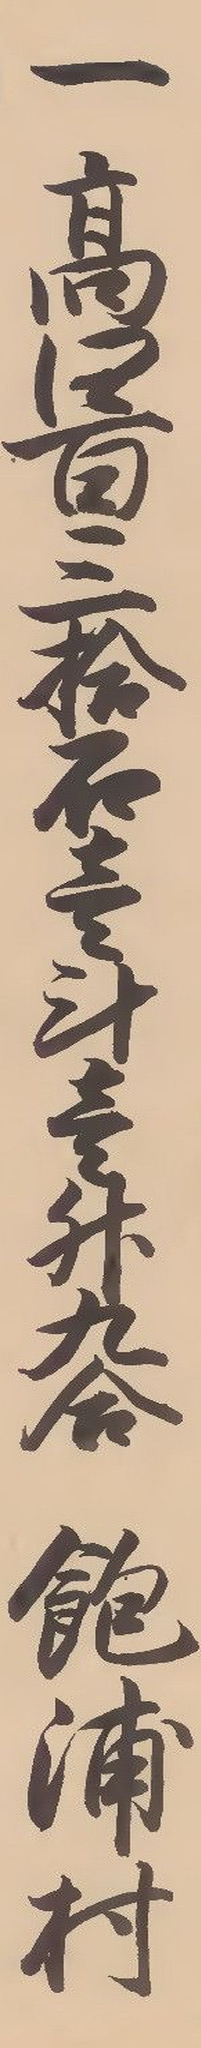一髙四百三拾石壱斗壱升九合飽浦村
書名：備前国郷帳
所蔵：国立公文書館 National Archives of Japan
